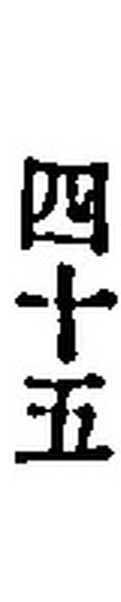四十五

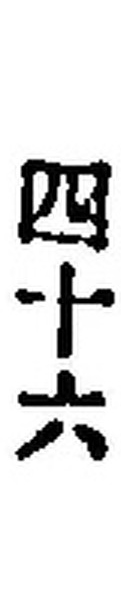四十六
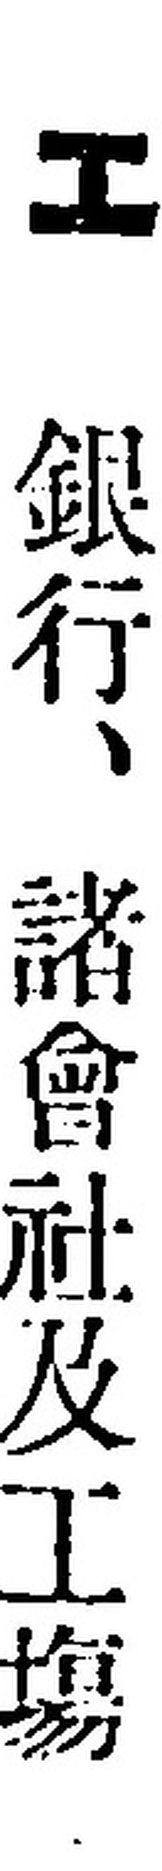エ銀行、諸會社及工場
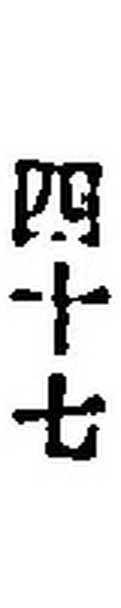四十七

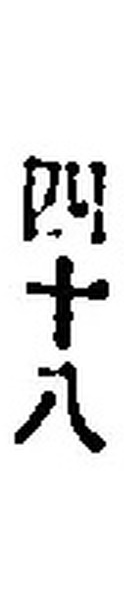四十八
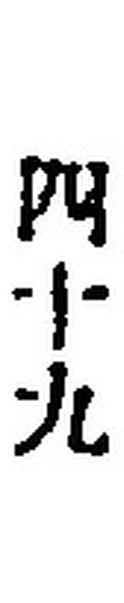四十九

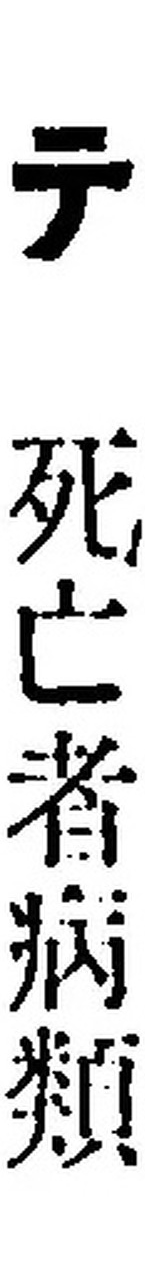テ死亡者病類
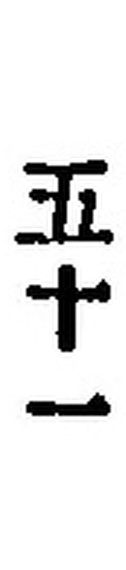五十一

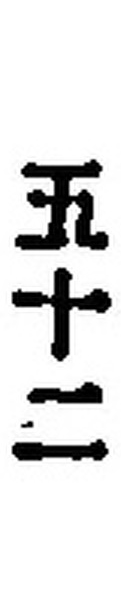五十二
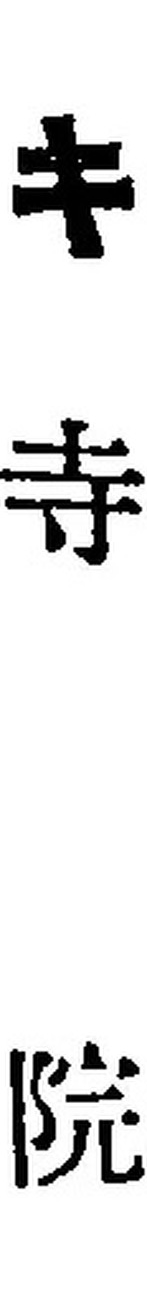キ寺院
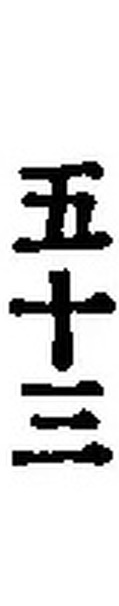五十三

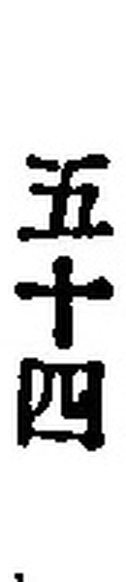五十四
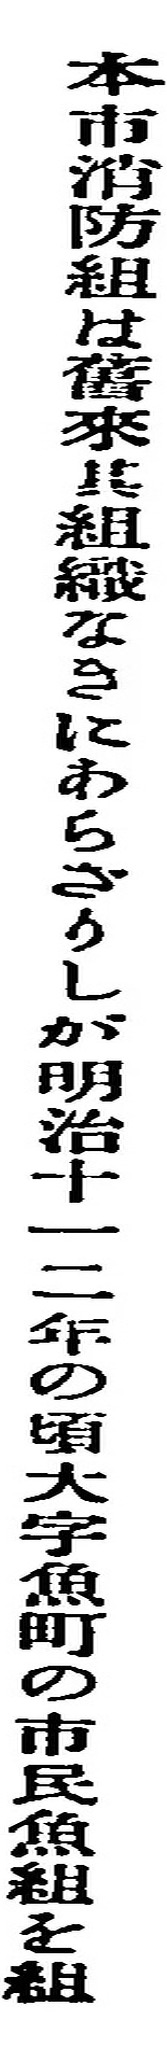本市消防組は舊來其組織なきにあらざりしが明治十一二年の頃大字魚町の市民魚組を組
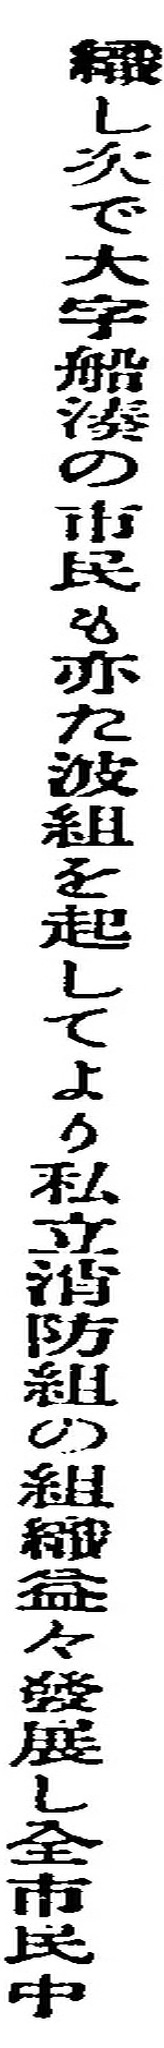織し次で大字船湊の市民も亦た波組を起してより私立消防組の組織益々發展し全市民中
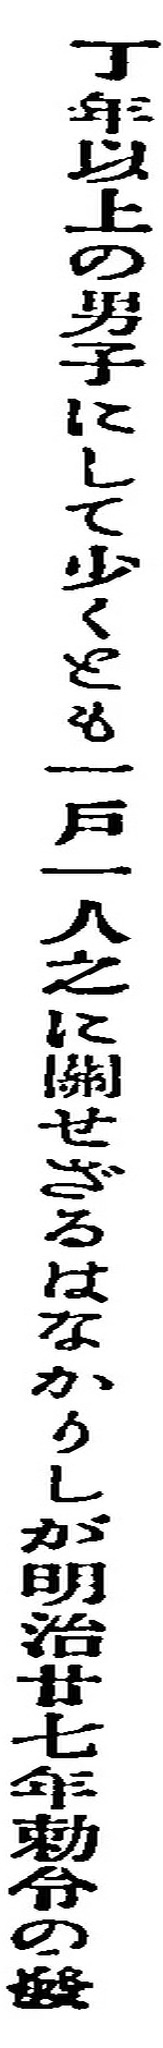丁年以上の男子にして少くとも一戸一人之に關せざるはなかりしが明治廿七年勅令の發
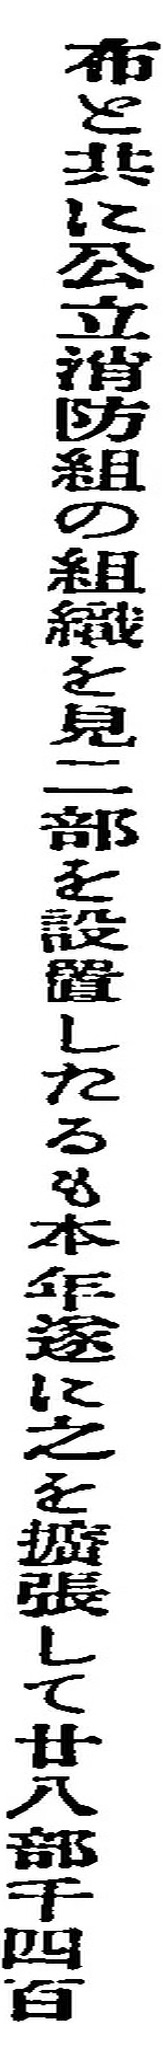布と共に公立消防組の組織を見二部を設置したるも本年遂に之を擴張して廿八部千四百
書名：豊橋志要
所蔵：国立国会図書館 National Diet Library, JAPAN
